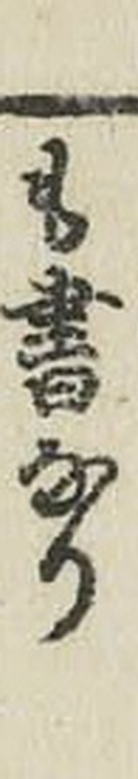も書なり
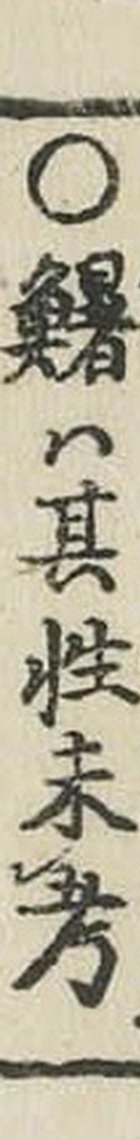○鱪は其性未考
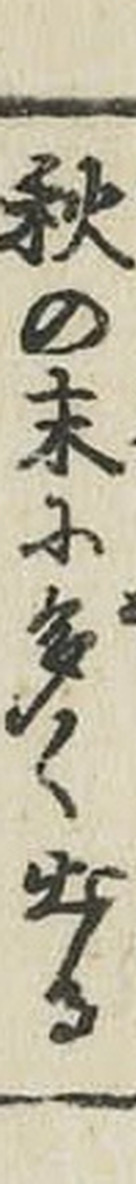秋の末に多く出る
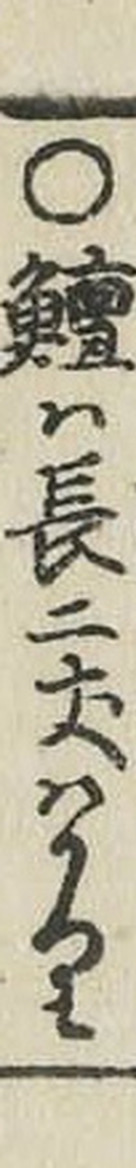○鱣は長二丈はかり
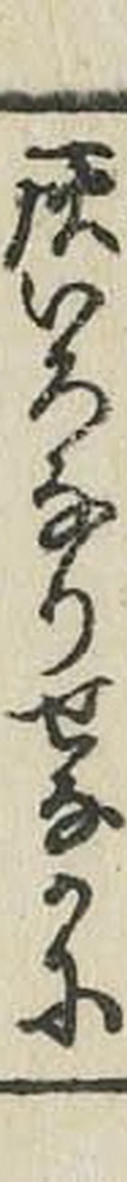灰いろなりせなかに
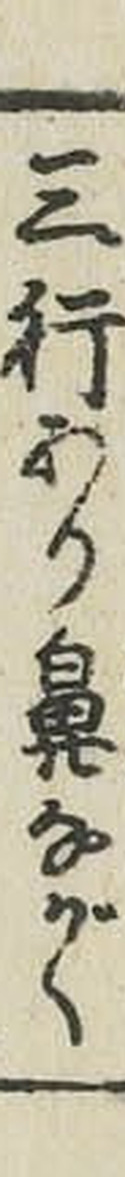三行あり鼻ながく
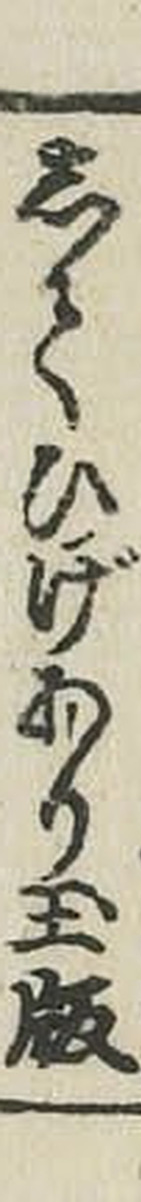してひげあり玉版
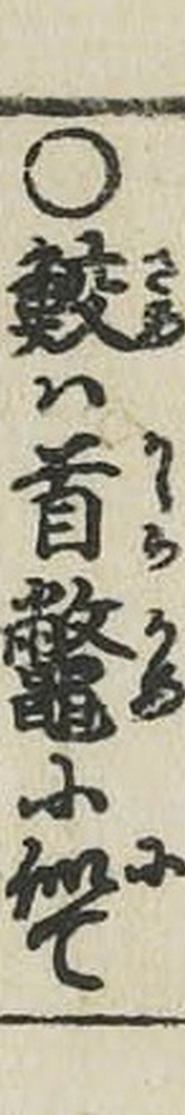○鮫は首鼈に似て
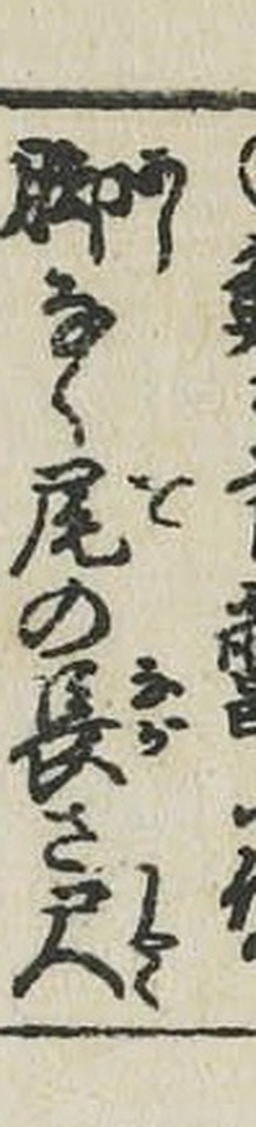脚なく尾の長さ尺

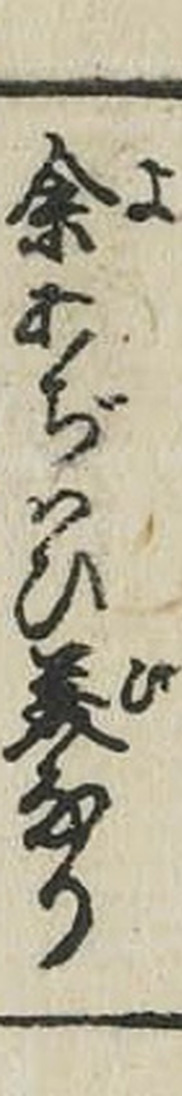余あじはひ美なり
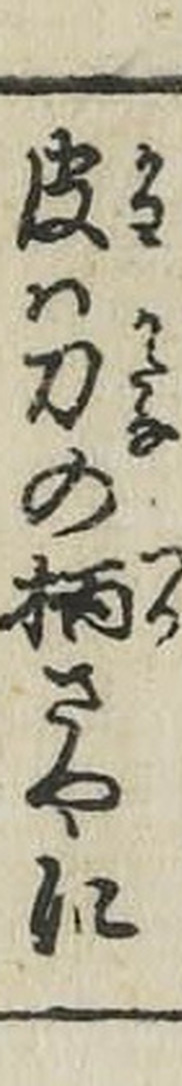皮は刀の柄さやに
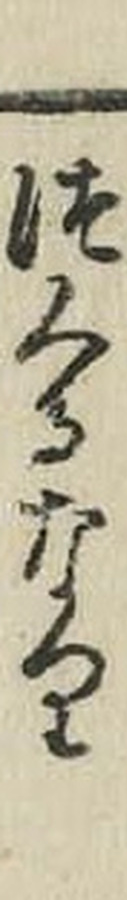つくるなり
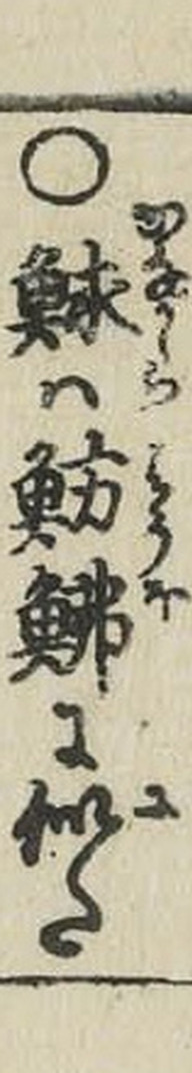○鯄は魴鮄に似た
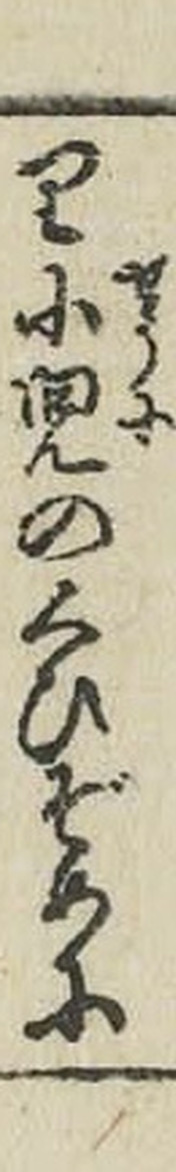り小児のくひぞめに
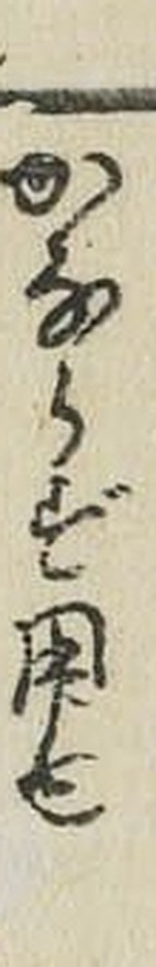かならず用ゆ
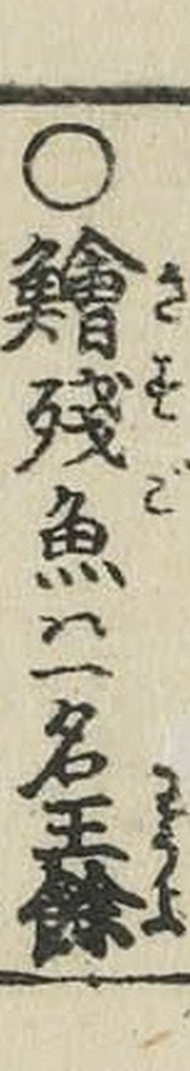○鱠残魚は一名王餘
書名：増補頭書訓蒙図彙大成 10巻 7:巻之14-16
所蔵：東京学芸大学教育コンテンツアーカイブ
